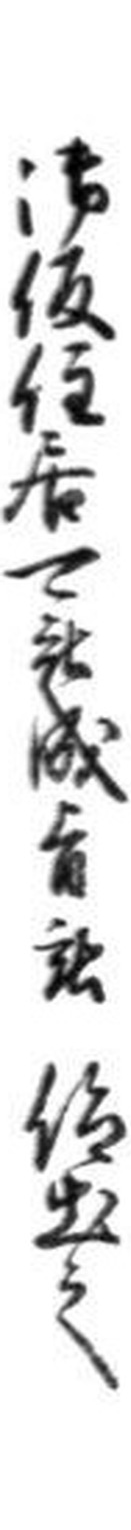御仮住居可被成旨被仰出之
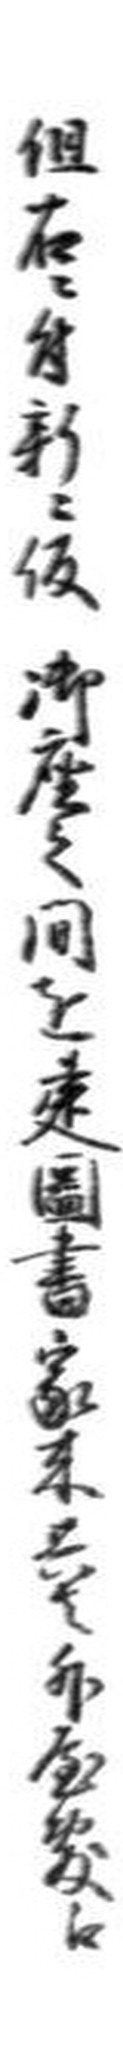但右ニ付新ニ仮御座之間を建図書家来共者外屋敷江
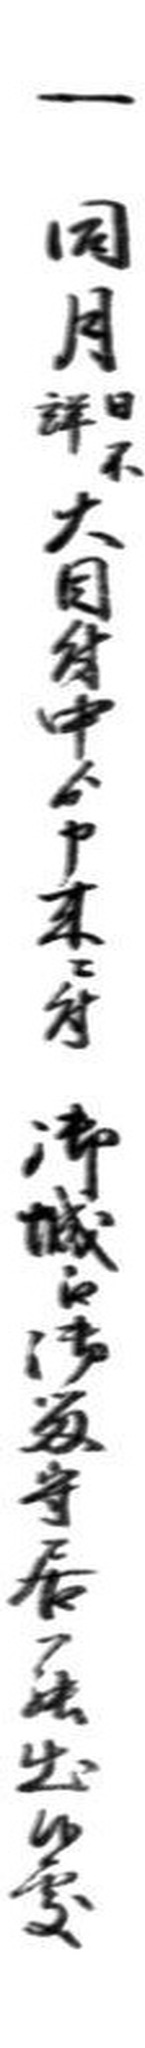一同月日不詳大目付中ゟ申来ニ付御城江御留守居罷出候処
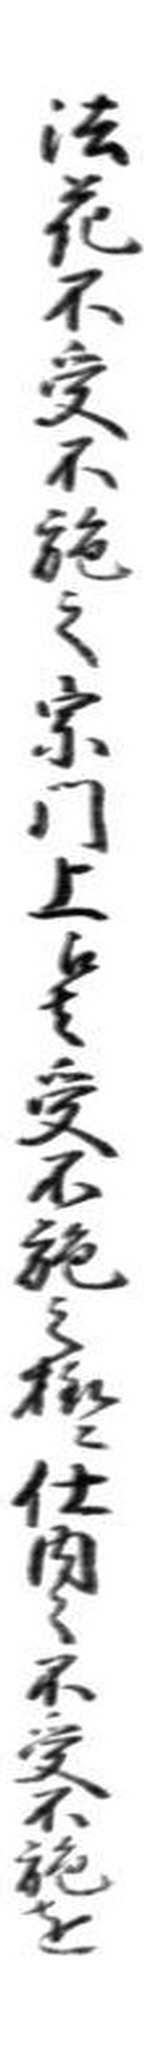法花不受不施之宗門上江者受不施之様ニ仕内々不受不施を
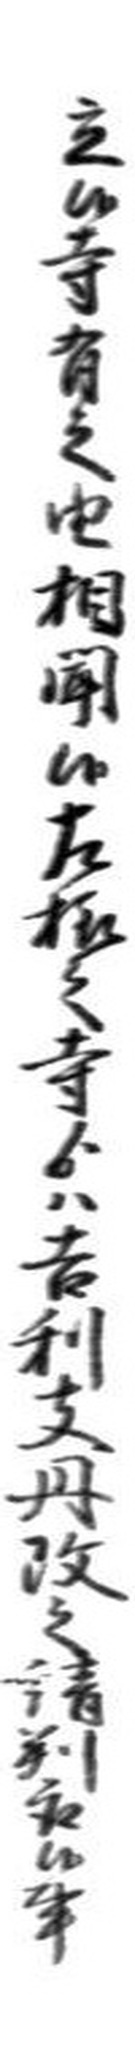立候寺有之由相聞候左様之寺ゟハ吉利支丹改之請判取候事
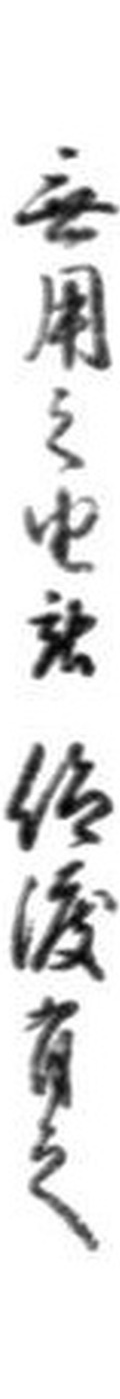無用之由被仰渡有之
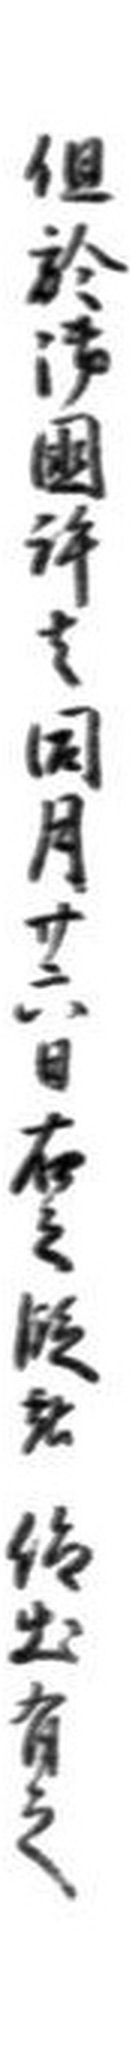但於御国許者同月廿六日右之段被仰出有之
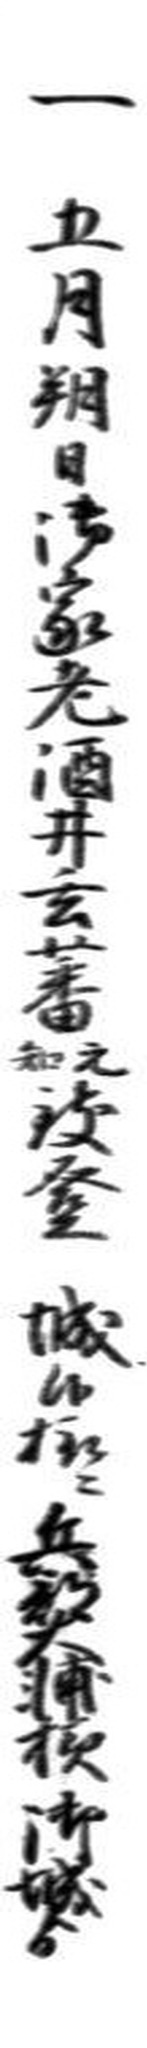一五月朔日御家老酒井玄蕃元知被登城候様ニ兵部大輔様御城ゟ
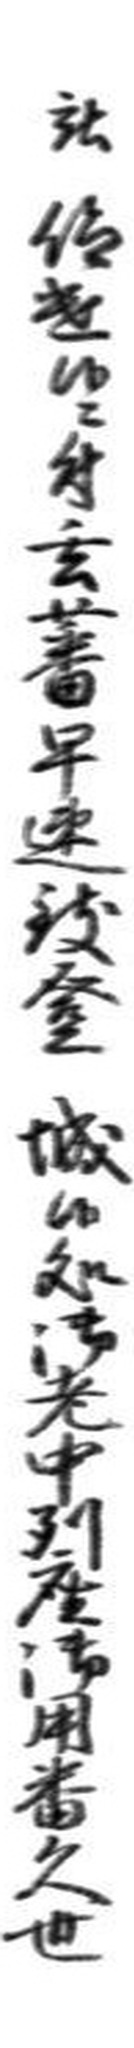被仰遣候ニ付玄蕃早速致登城候処御老中列座御用番久世
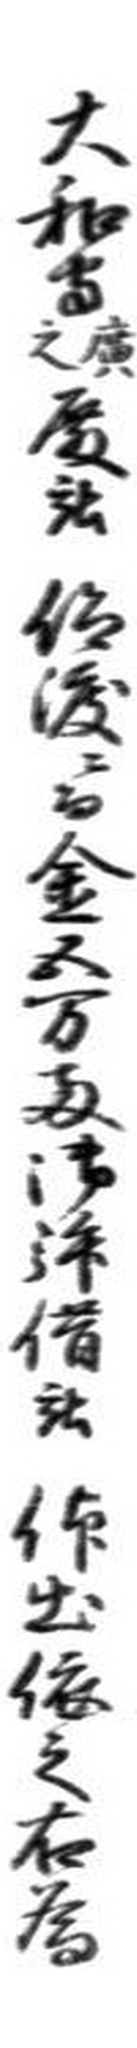大和守広之殿被仰渡ニ而金五万両御拝借被仰出依之右為

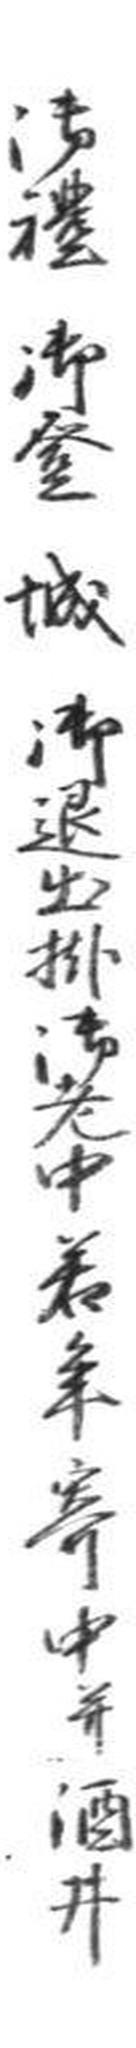御礼御登城御退出掛御老中若年寄中并酒井
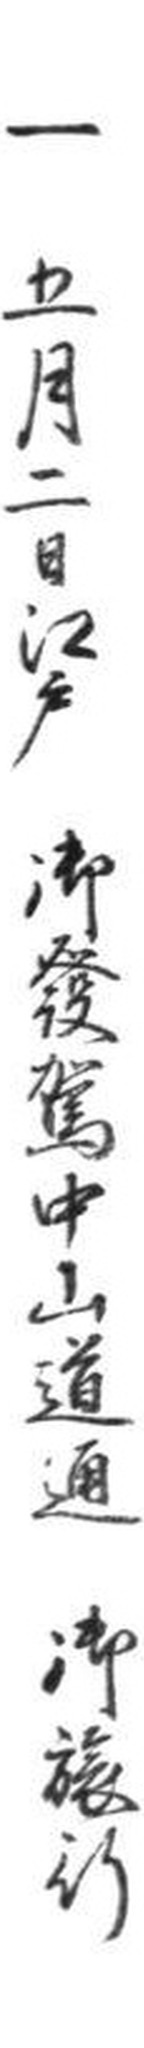一五月二日江戸御発駕中山道通御旅行
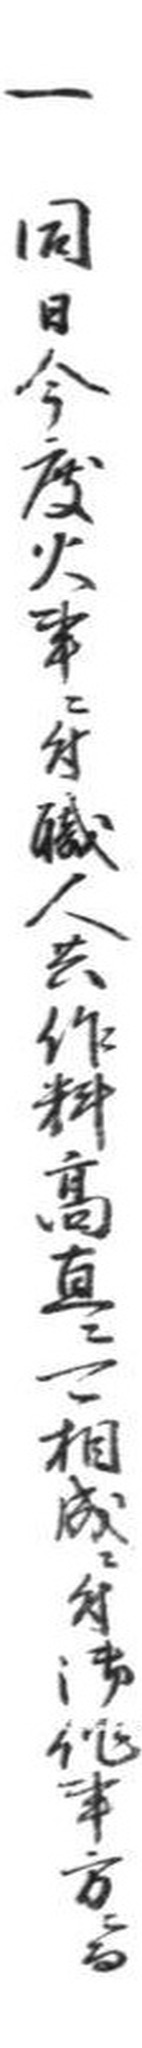一同日今度火事ニ付職人共作料高直ニ可相成ニ付御作事方ニ而
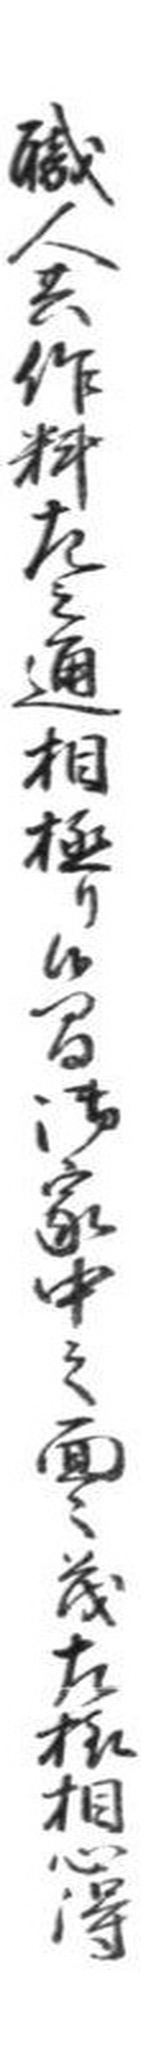職人共作料左之通相極リ候間御家中之面々も左様相心得
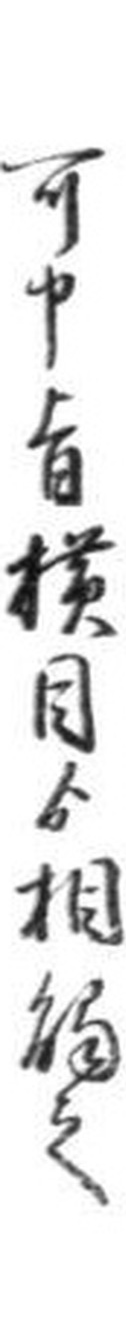可申旨横目ゟ相触之
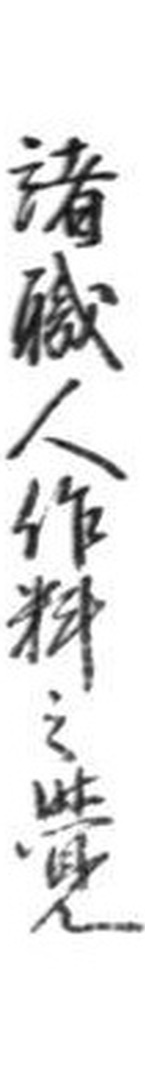諸職人作料之覚
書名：家譜 七 光通公 従寛文四年到同九年
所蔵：福井県文書館 Fukui Prefectural Archives
